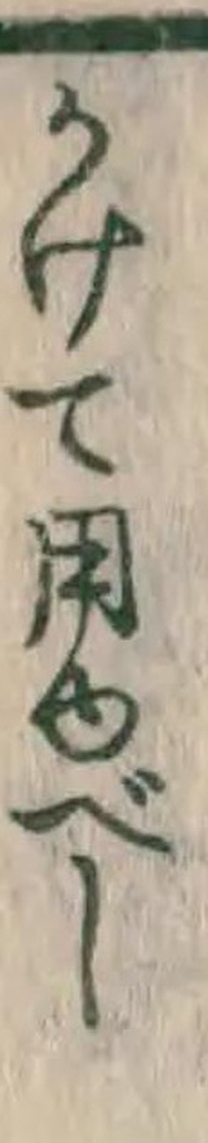かけて用ゆべし
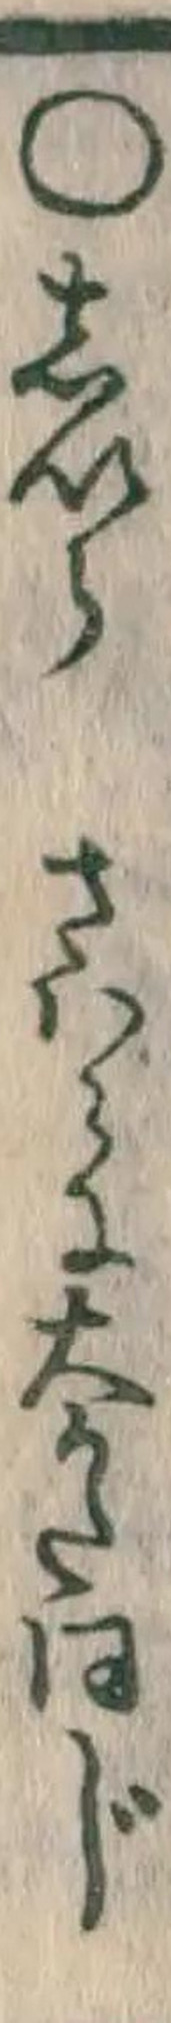○しいらさはらに大かた同じ
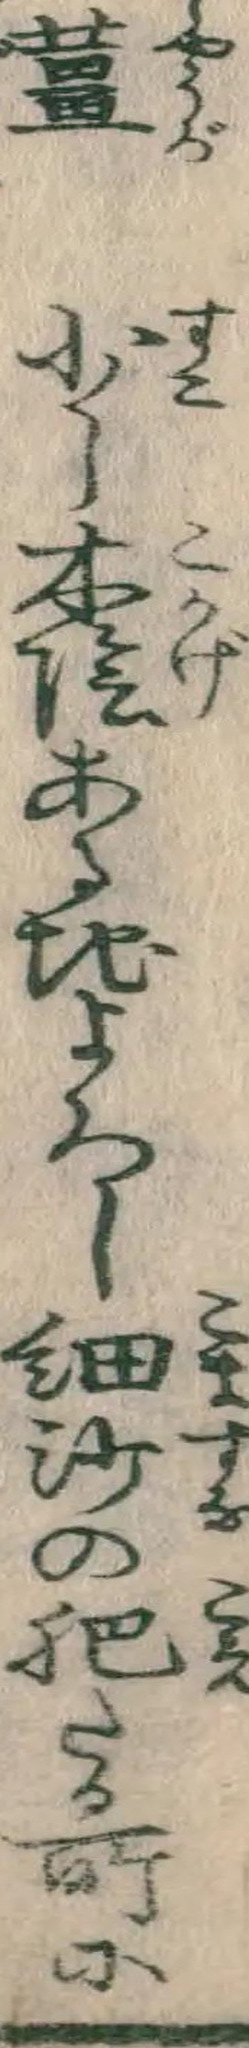一薑少し木陰ある地よろし細沙の肥たる所に
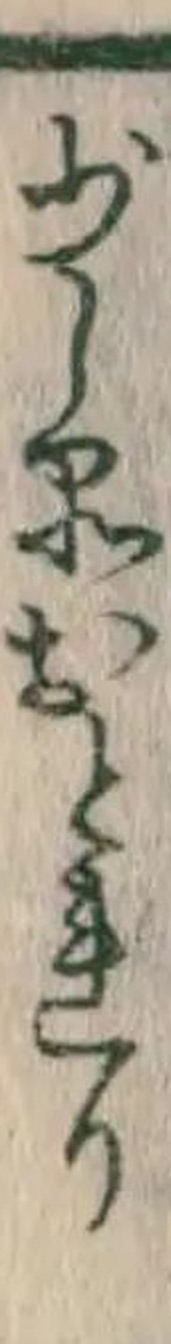少し品おとれり
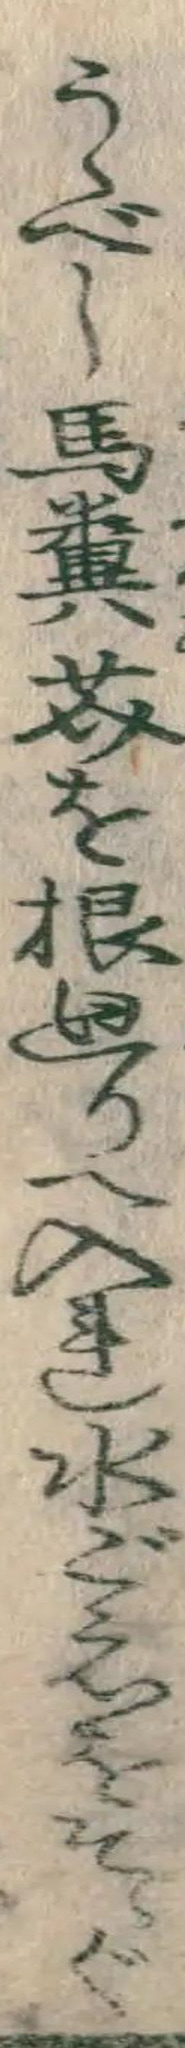うゝべし馬糞芥を根廻りへ入れ水ごえをそゝぐ
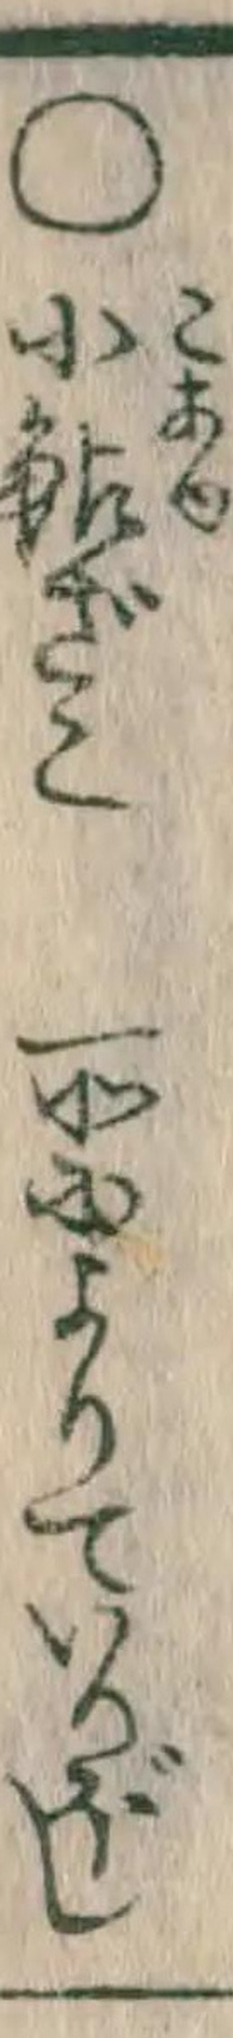○小鮎ざこ所によりていりぼし
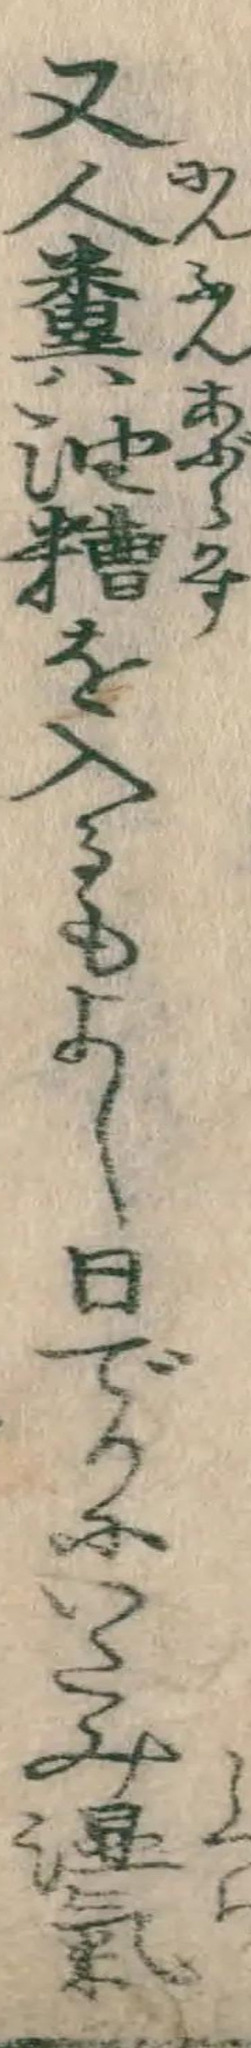又人糞油糟を入るもよし日でりにいたみ湿気
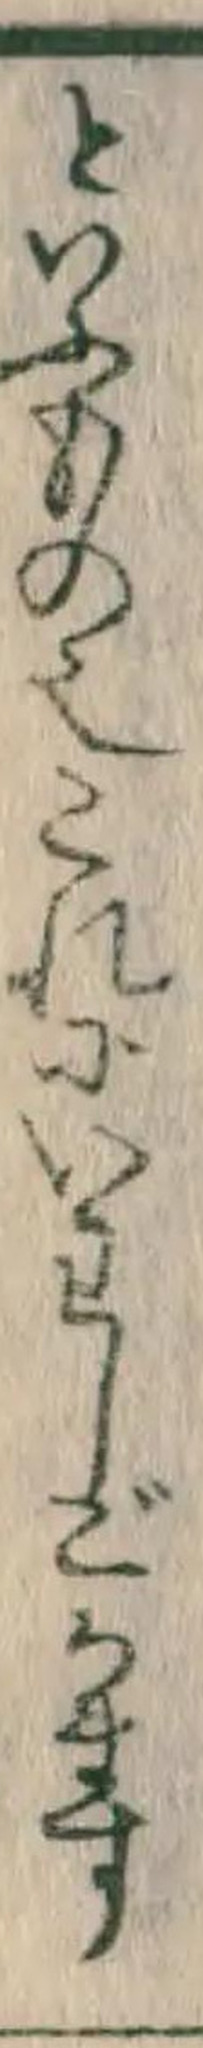といふもの也これにいわしごかます
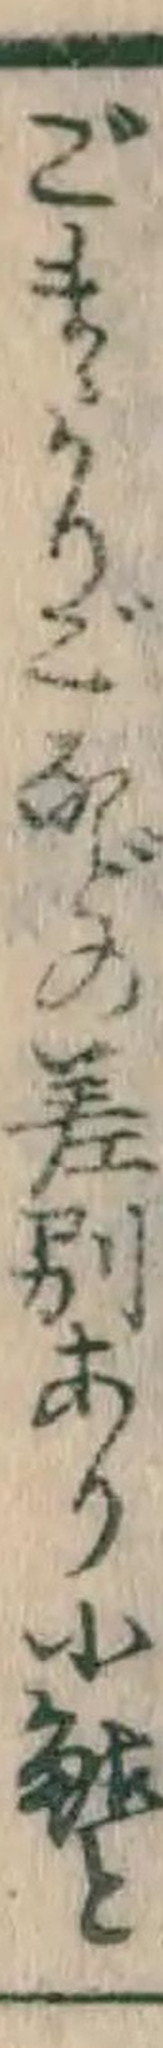ごまゝかりごなどの差別あり小鮎と
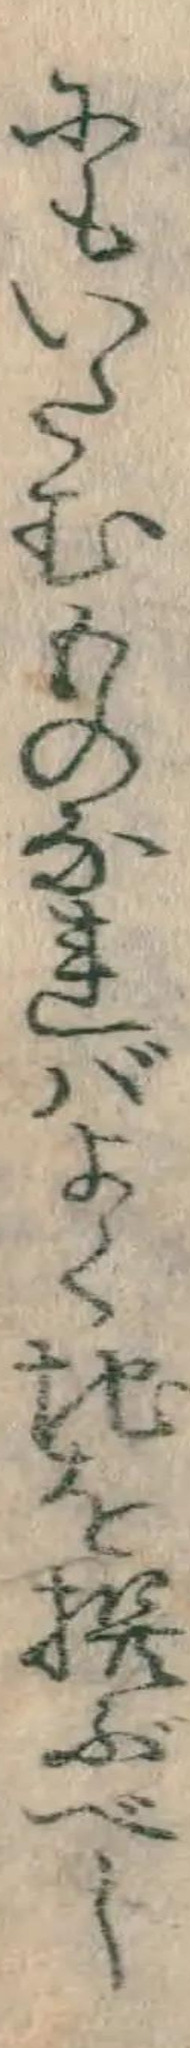にもいたむものなればよく地を撰ぶべし

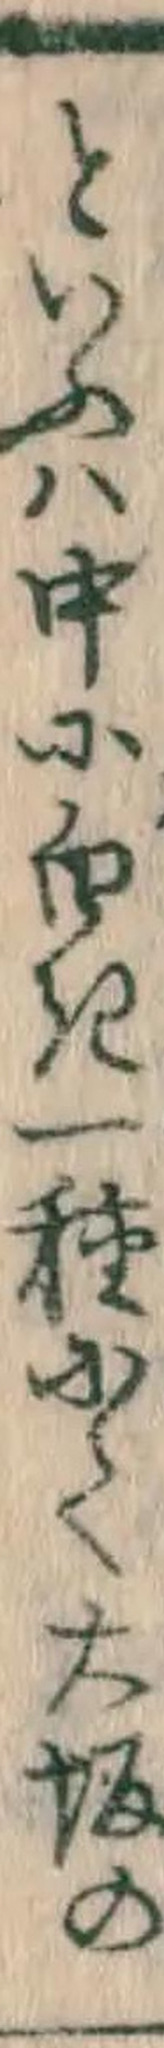といふは中に白き一種にて大坂の
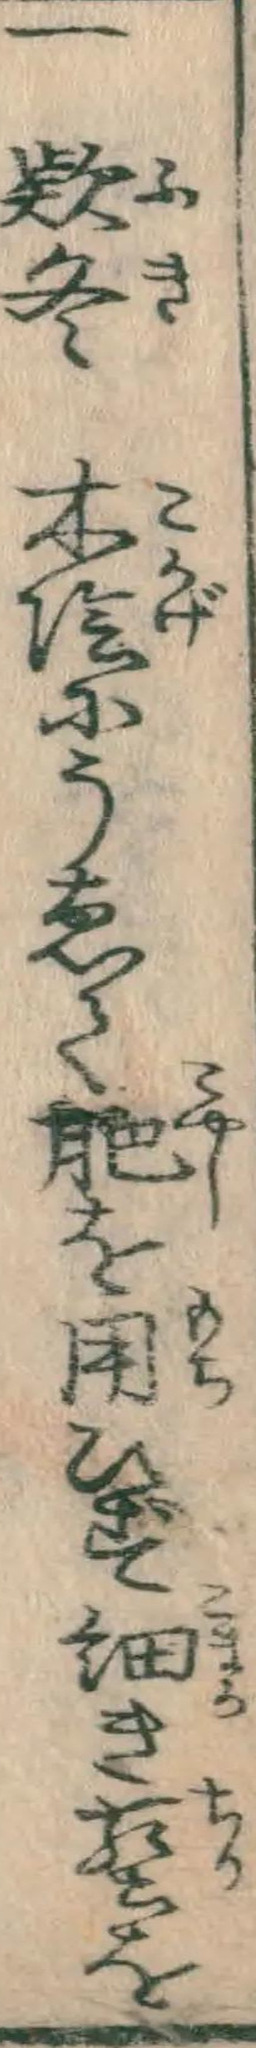一款冬木陰にうゑて肥を用ひず細き塵を
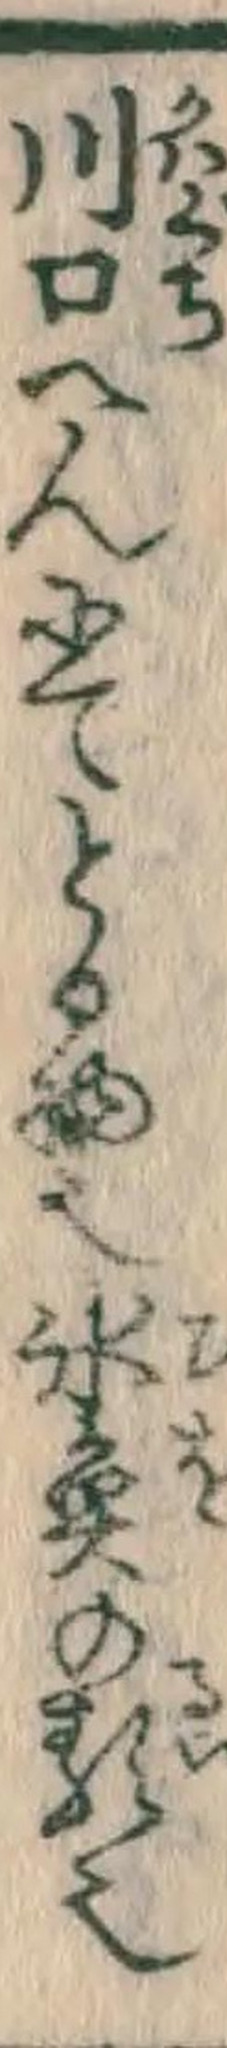川口へんにてとる物也氷魚の類也
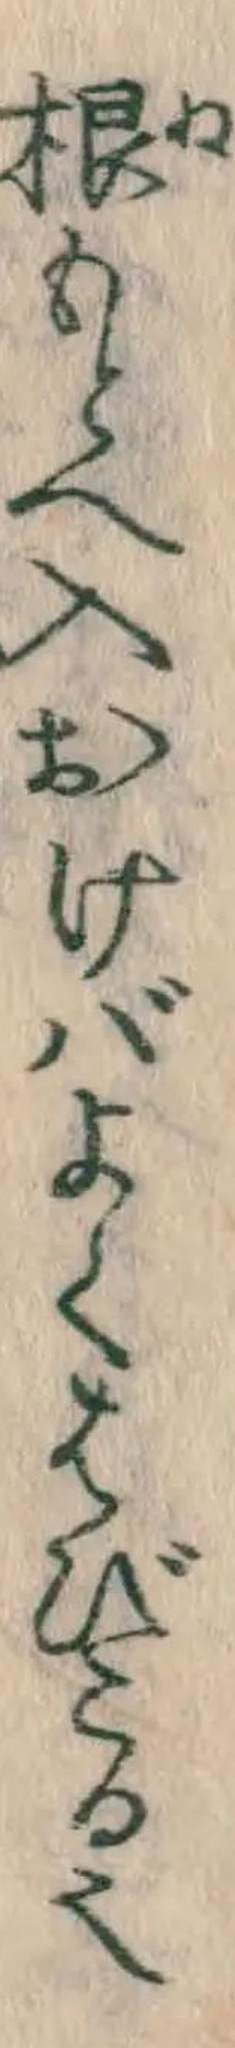根もとへ入おけばよくはびこる也
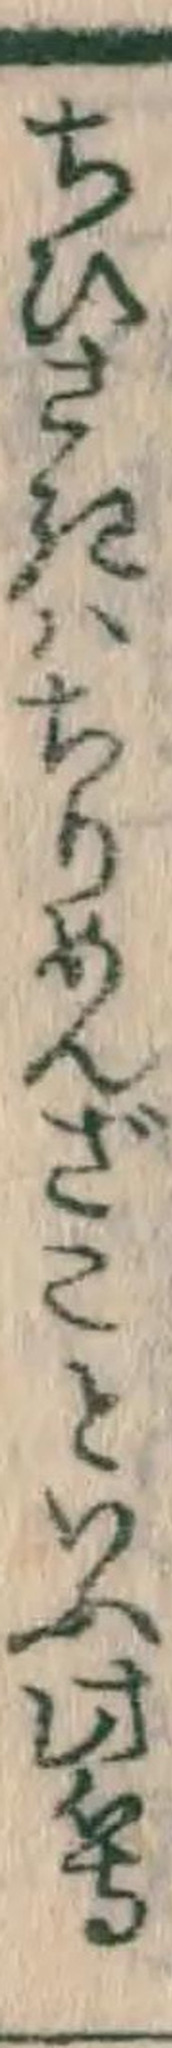ちひさきはちりめんざこといふ此等
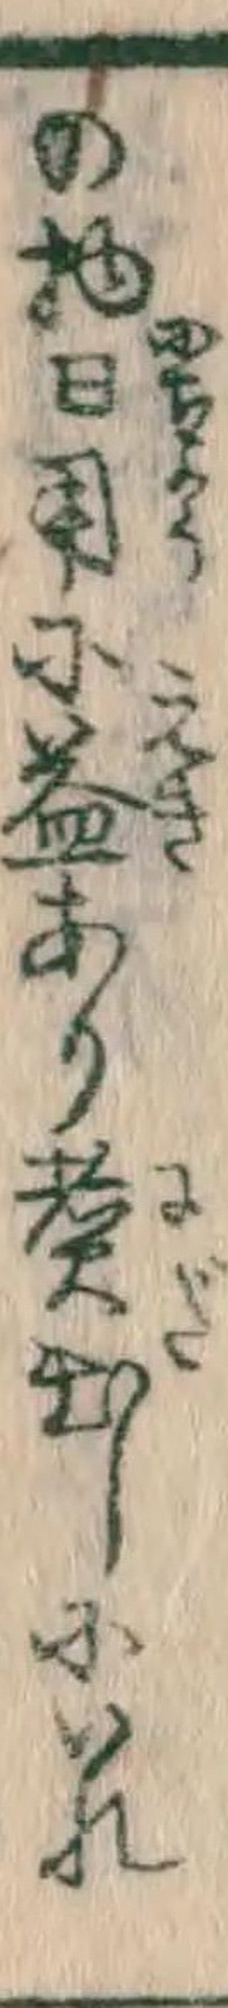の物日用に益あり煮出しにいれ
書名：広益秘事大全 3巻. [5]
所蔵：国立国会図書館 National Diet Library, JAPAN
